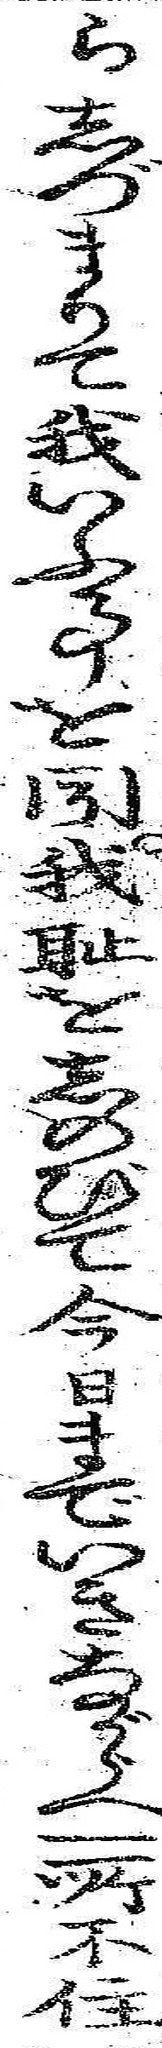らしづまりて我いふ事を聞。我恥をしのびて今日までいきながらへ。一所不住

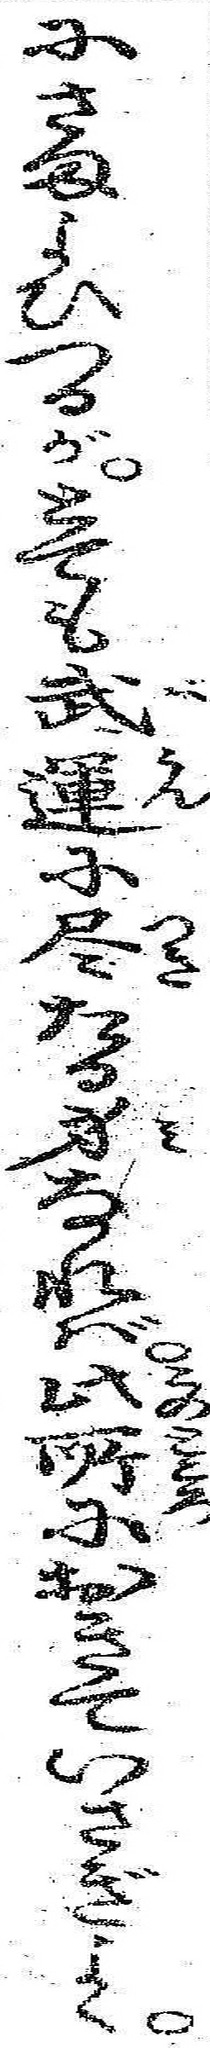にさまよひつるが。とても武運に尽たる身なれば。此所におきていさぎよく。
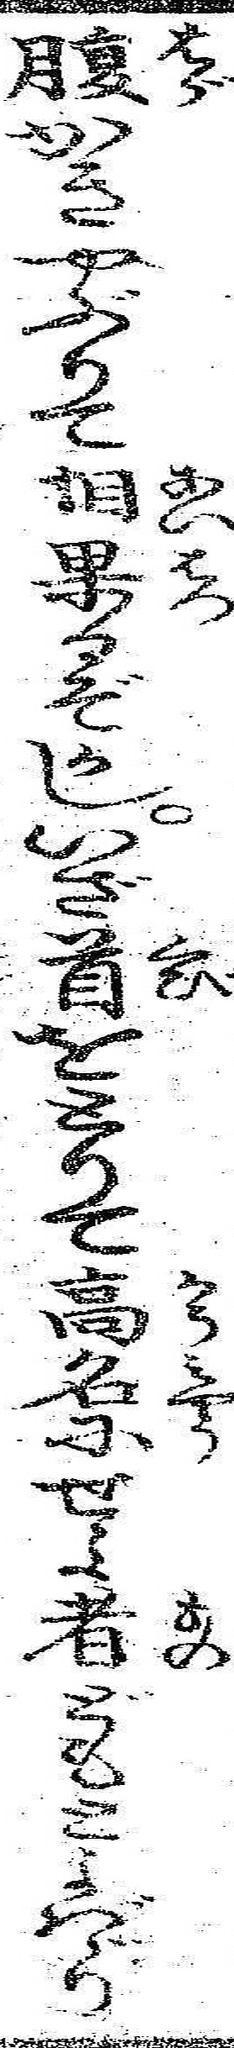腹かきやぶりて相果るぞかし。いざ首をとりて高名にせよ者どもとよばゞり
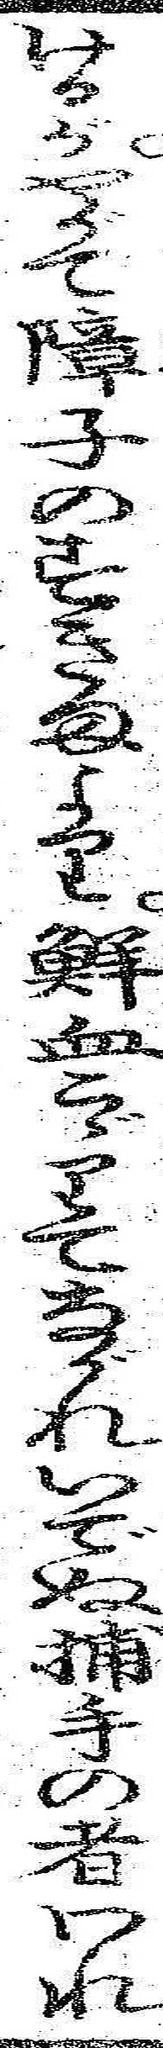けるが。やがて障子のすきまより。鮮血こゞりてながれいでぬ。捕手の者われ
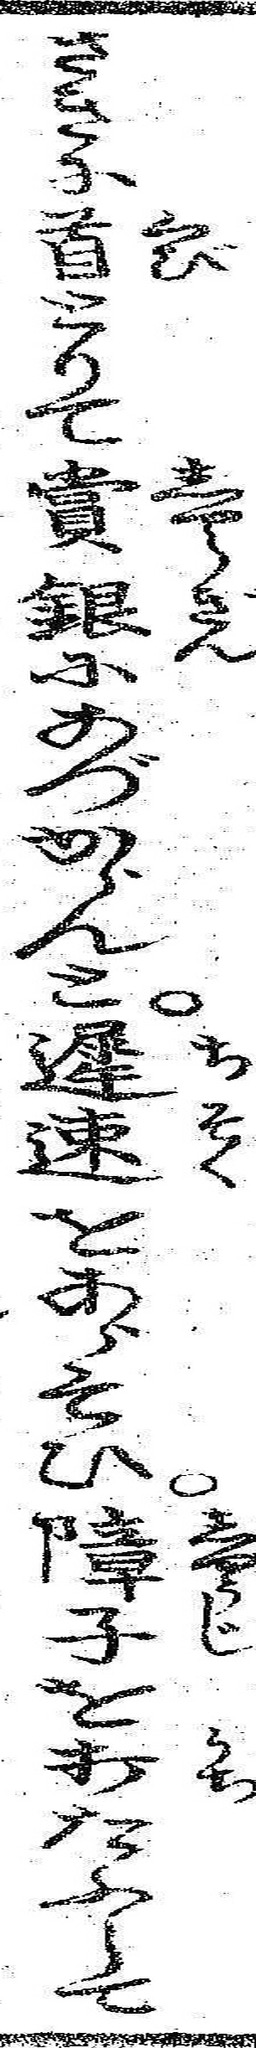さきに首とりて賞銀にあづからんと。遅速をあらそひ。障子を打たふして
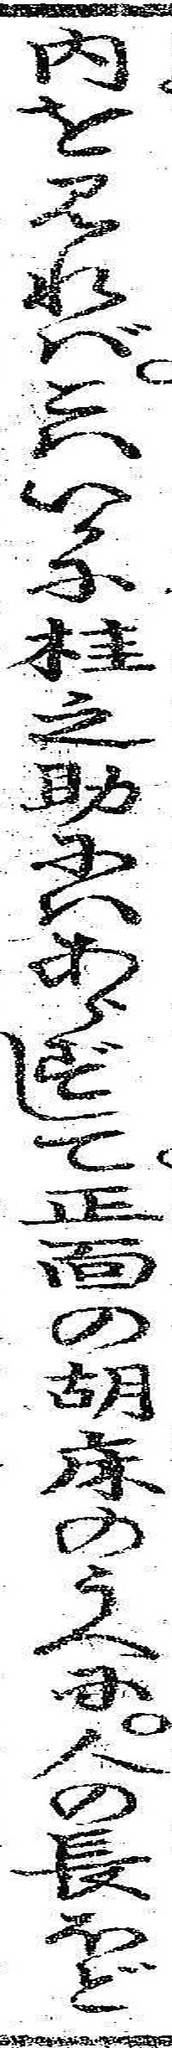内を見れば。こはいかに桂之助にはあらずして。正面の胡床のうへに。人の長ほど
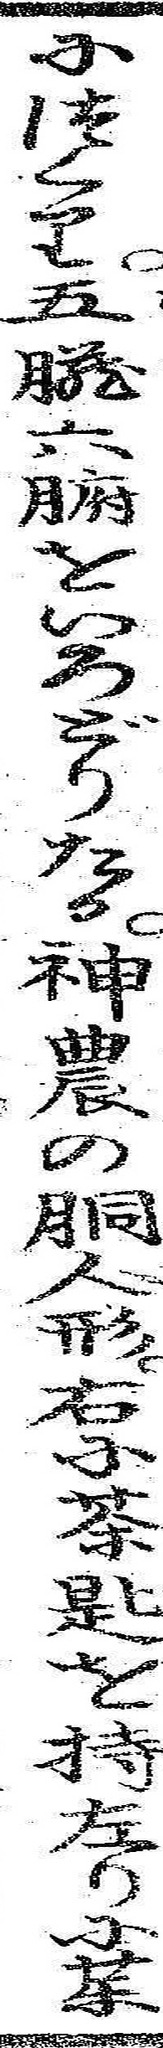につくり。五臓六腑をいろどりたる。神農の胴人形。右に茶匙を持左りに薬
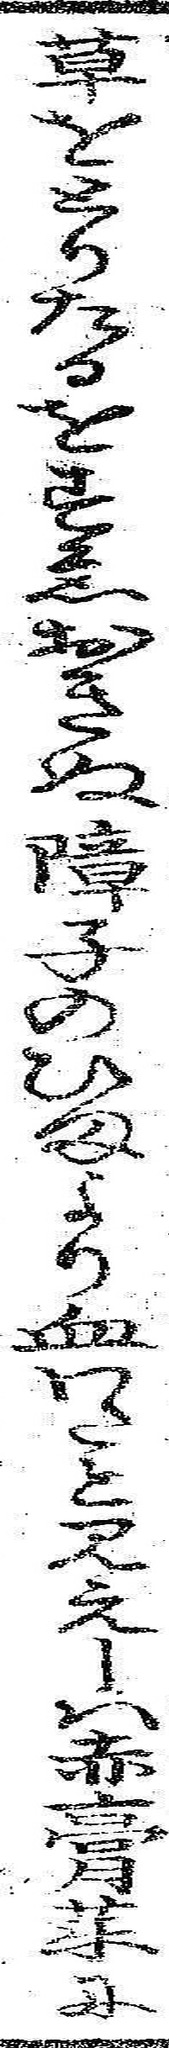草をとりたるをすゑおきぬ。障子のひまより血わたと見えしは。赤膏薬に
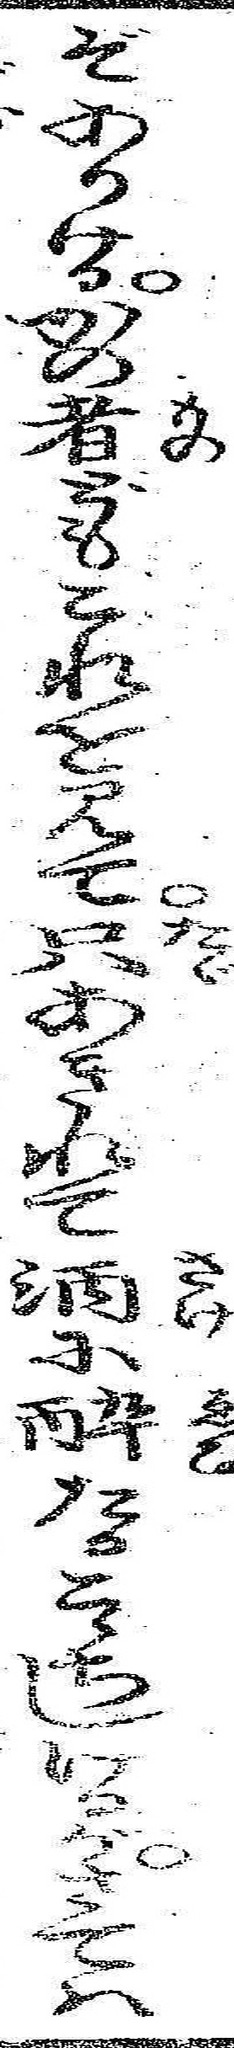ぞありける。かの者どもこれを見て。只あきれて酒に酔たるこゝちしけるが。さては
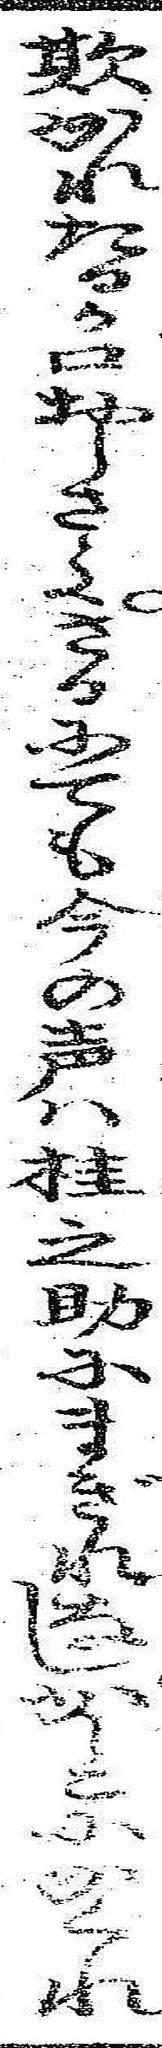欺かれたるか口おしさよ。さるにても今の声は桂之助にまぎれなし。かしこにかくれ
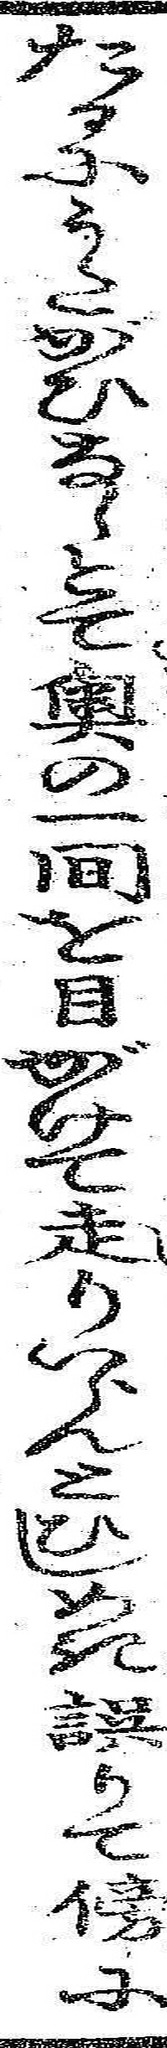たるにうたがひなしとて。奥の一間を目がけて走りいらんとひしめき。誤りて傍に
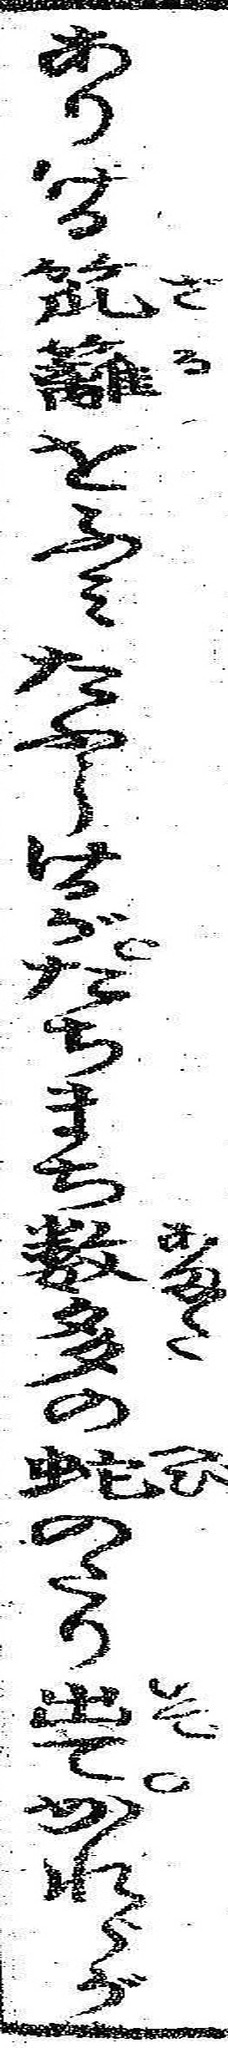ありける笊籬をふみたふしけるが。たちまち数多の蛇のたり出て。かれらが
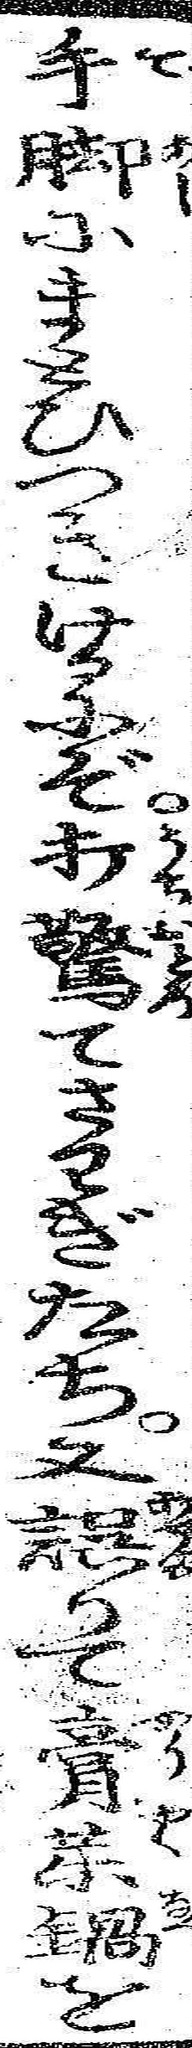手脚にまとひつきけるにぞ。打驚てさわぎたち。又誤りて膏薬鍋を
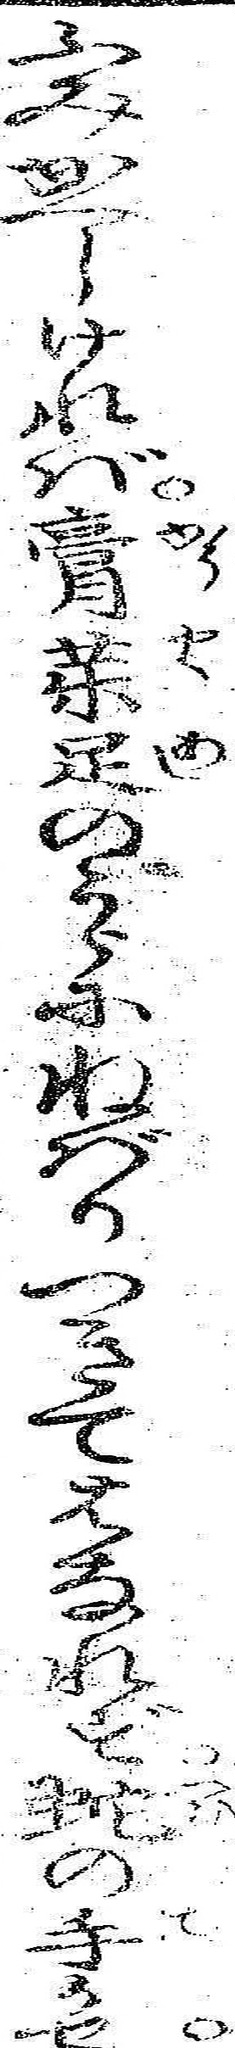ふみかへしければ。膏薬足のうらにねばりつきてはなれず。蛇の手かせ。
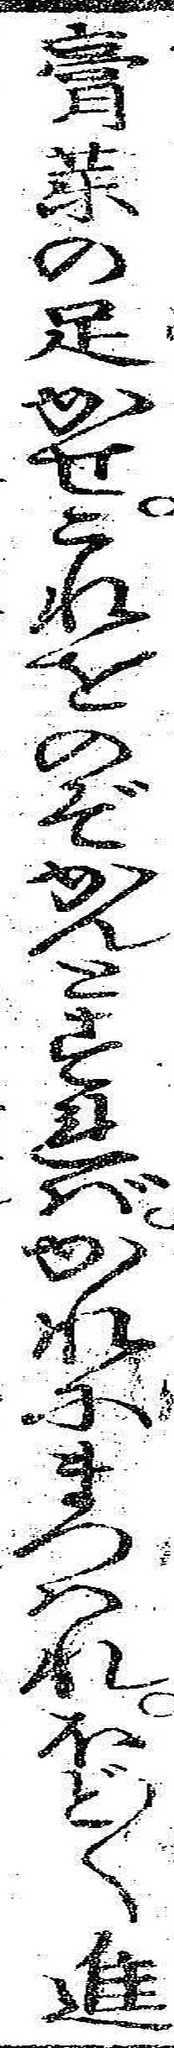膏薬の足かせ。これをのぞかんとすれば。かれにまつはれ。ほど〳〵進
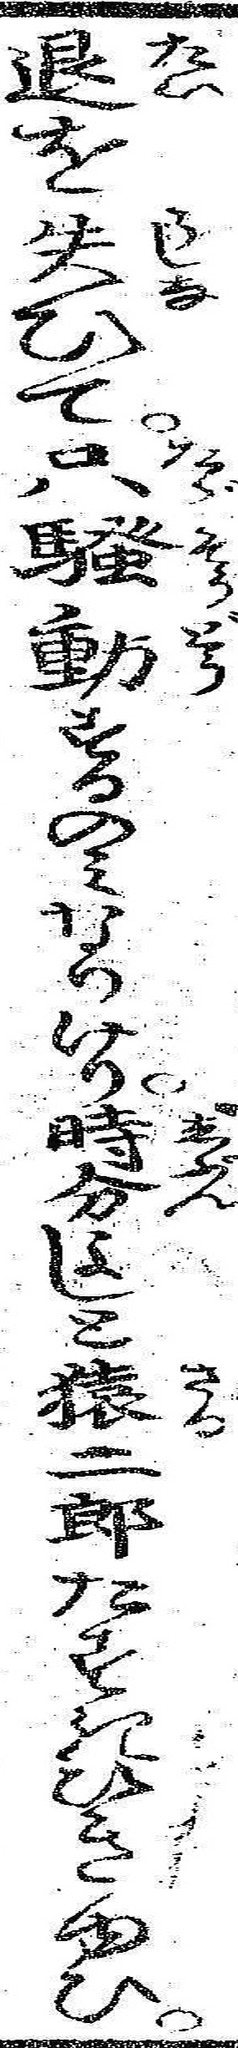退を失ひて。只騒動するのみなりけり。時分よしと猿二郎たすきひきゆひ。
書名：昔話稲妻表紙
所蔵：国文学研究資料館
